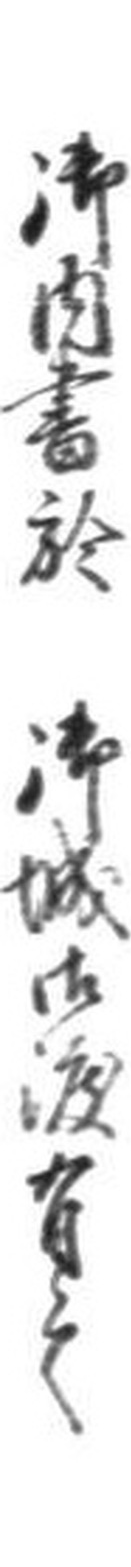御内書於御城御渡有之
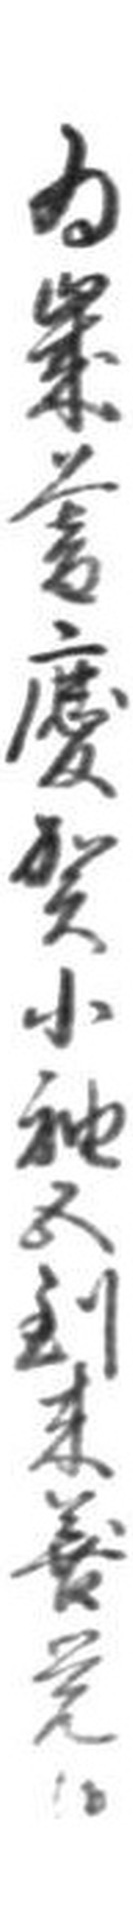為歳暮慶賀小袖五到来善覚候
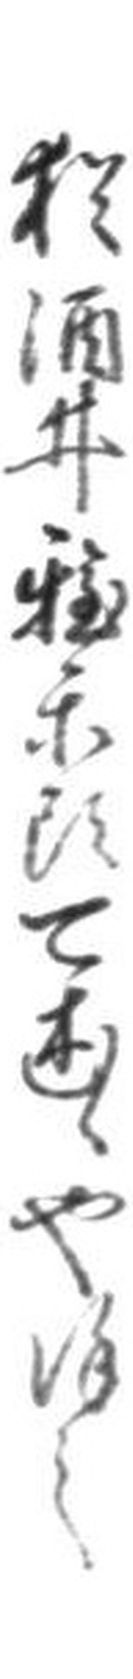猶酒井雅楽頭可述候也謹言
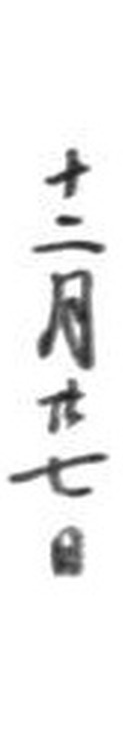一十二月七日

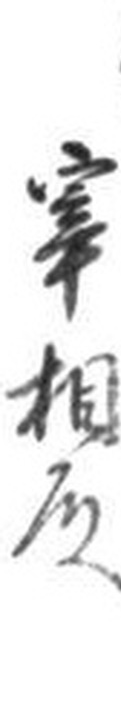宰相殿
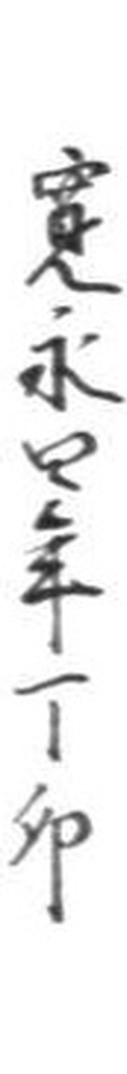寛永四年丁卯
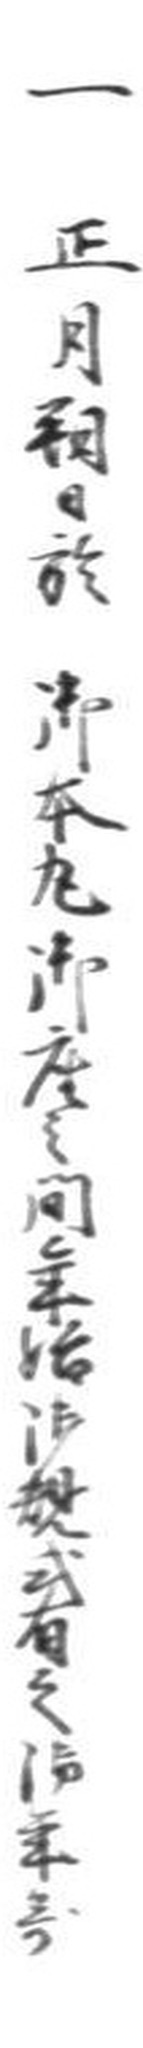一正月朔日於御本丸御座之間年始御規式有之御年寄
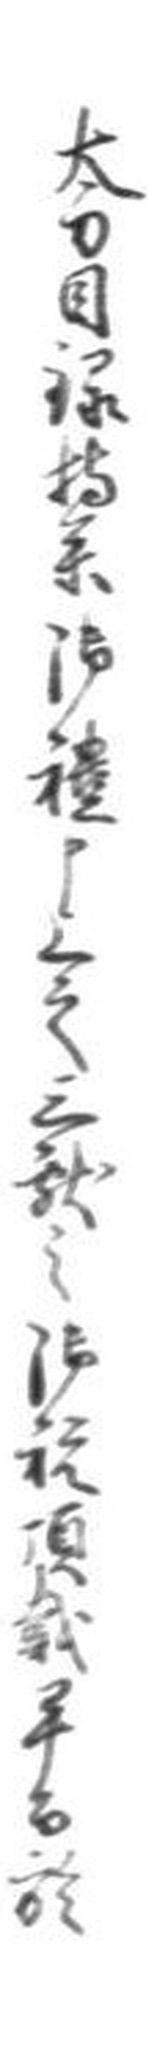太刀目録持参御礼申上之三献之御祝頂戴畢而於
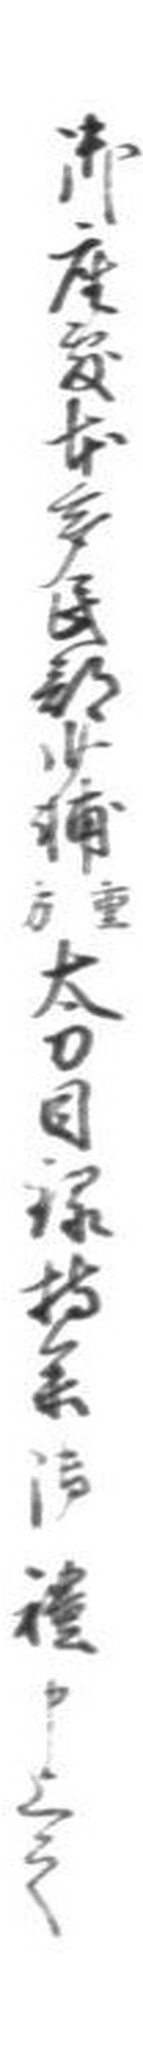御座敷本多民部少輔重方太刀目録持参御礼申上之
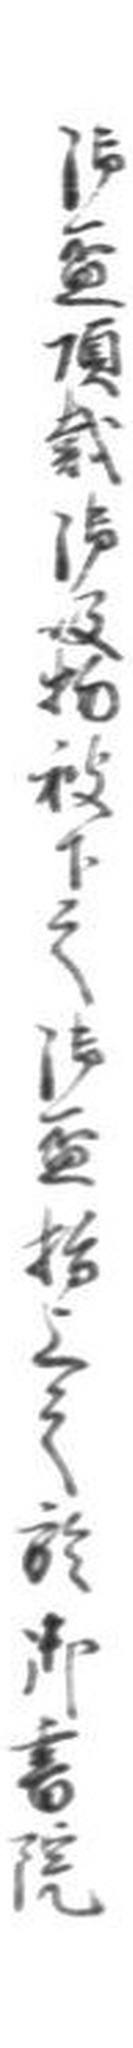御盃頂戴御吸物被下之御盃指上之於御書院
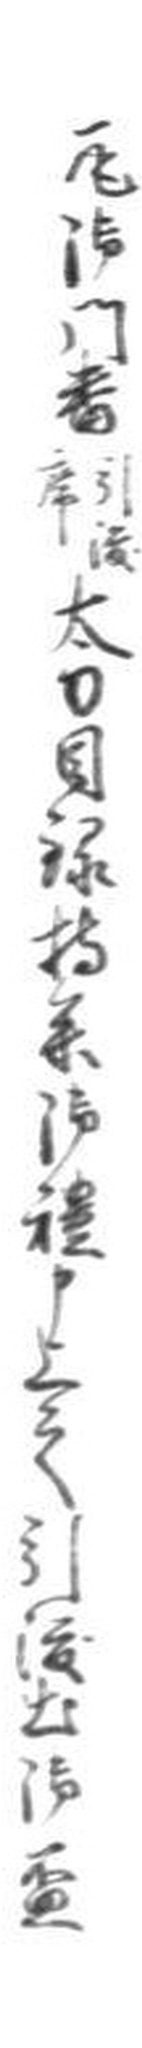瓦御門番引渡席太刀目録持参御礼申上之引渡出御盃
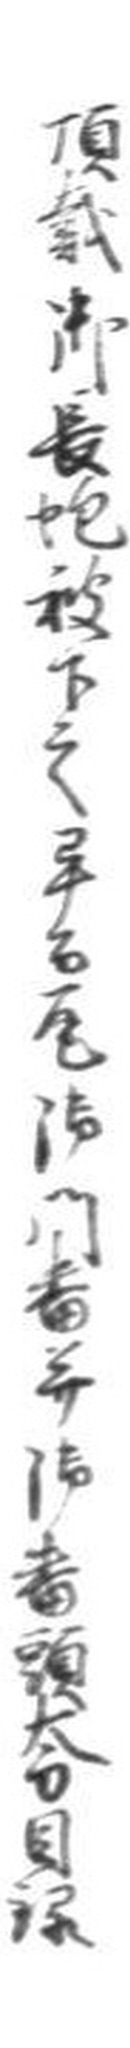頂戴御長蚫被下之畢而瓦御門番并御番頭太刀目録
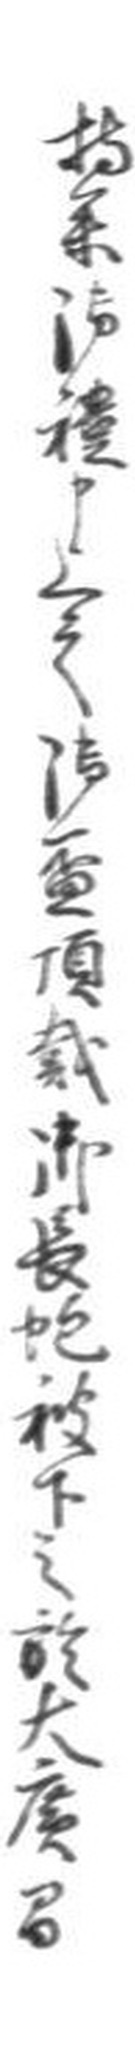持参御礼申上之御盃頂戴御長蚫被下之於大広間

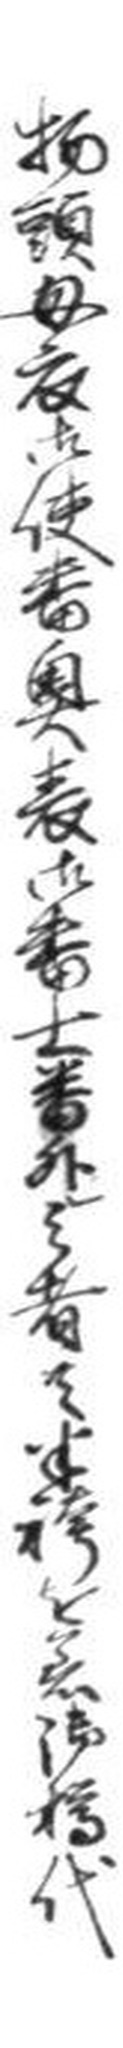物頭母衣御使番奥表御番士番外之者は半袴を着御樽代
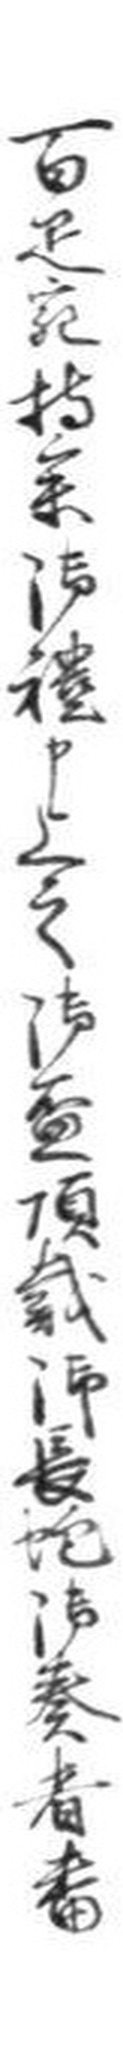百疋宛持参御礼申上之御盃頂戴御長蚫御奏者番
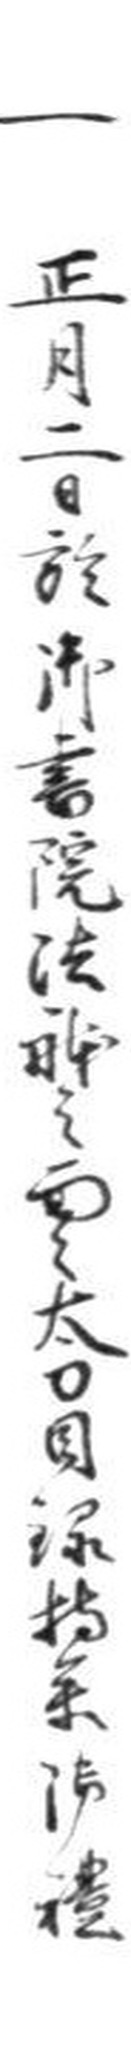一正月二日於御書院法躰之面々太刀目録持参御礼
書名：家譜 三 忠昌公 従慶長八年到寛永六年
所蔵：福井県文書館 Fukui Prefectural Archives
